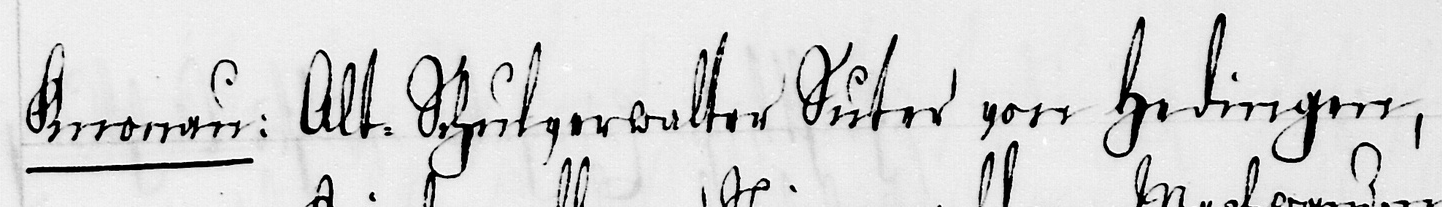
Knonau: Alt-Schulverwalter Suter von Hedingen,
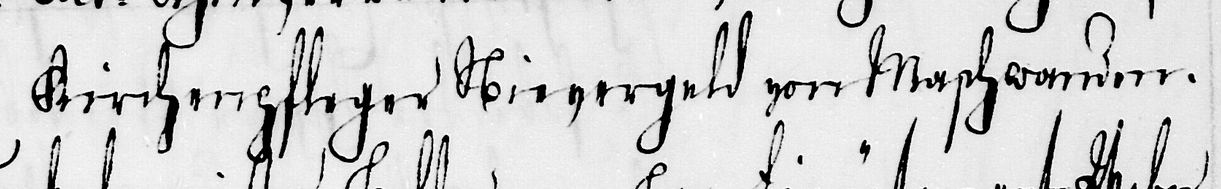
Kirchenpfleger Nievergeld von Maschwanden.
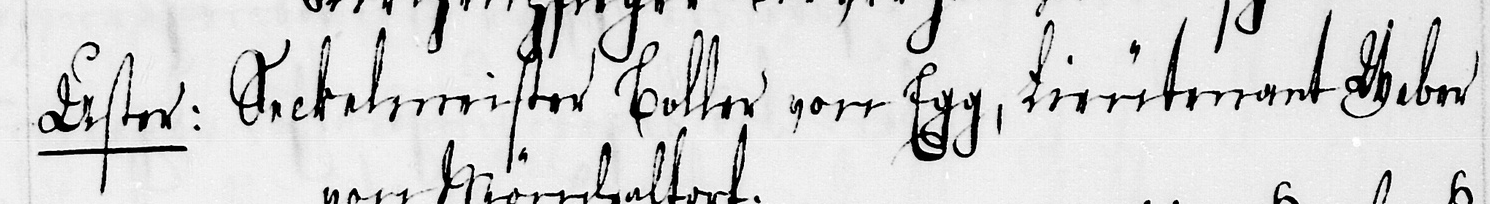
Uster: Seckelmeister Boller von Egg, Lieutenant Weber
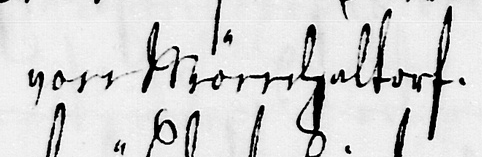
von Mönchaltorf.
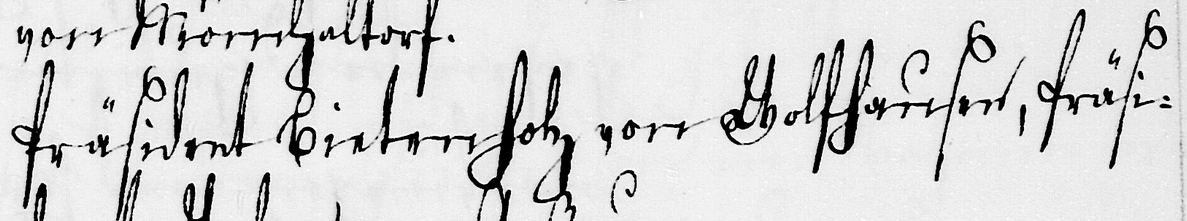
Präsident Bietenholz von Wolfhausen, Präs¬
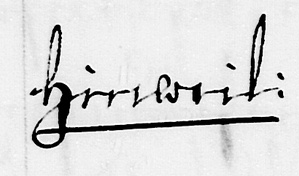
Hinweil:
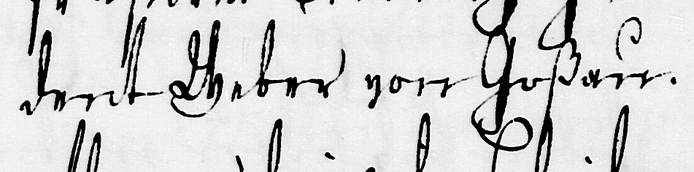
ident Weber von Goßau.
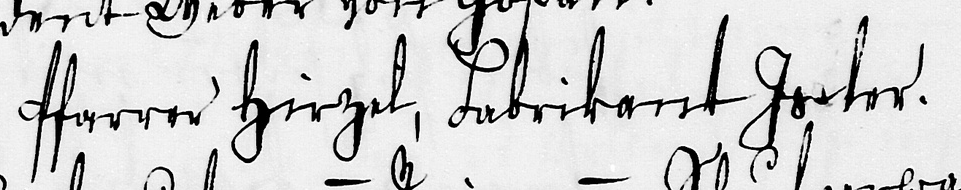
Pfarrer Hirzel, Fabrikant Isler.
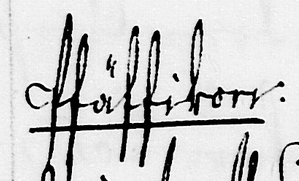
Pfäffikon:
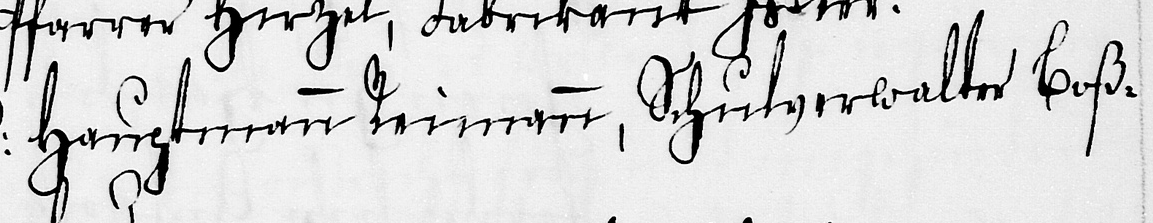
Hauptmann Reimann, Schulverwalter Boß¬
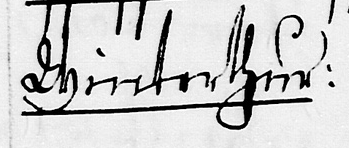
Winterthur:
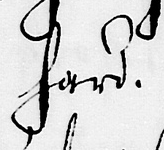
hard.
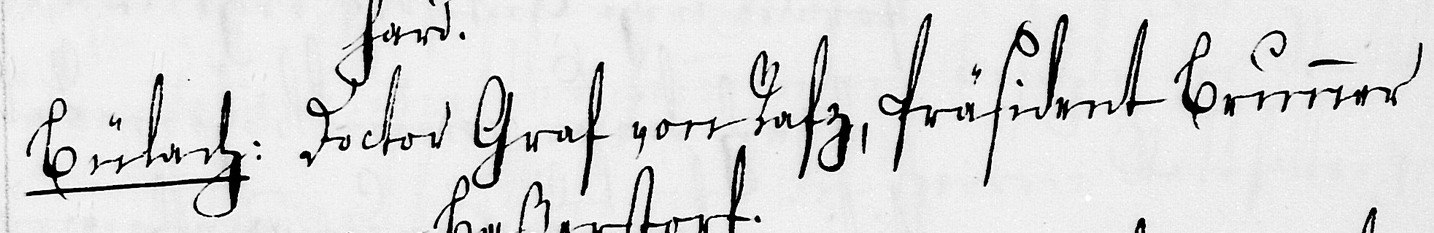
Bülach: Doctor Graf von Rafz, Präsident Brunner
